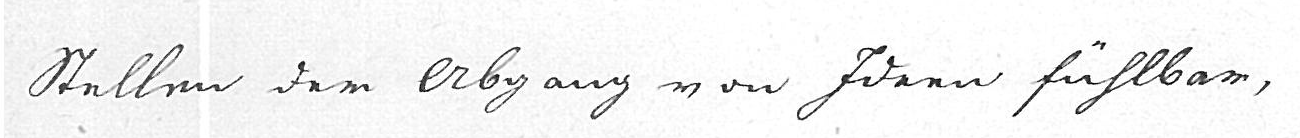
Stellen der Abgang von Ideen fühlbar,
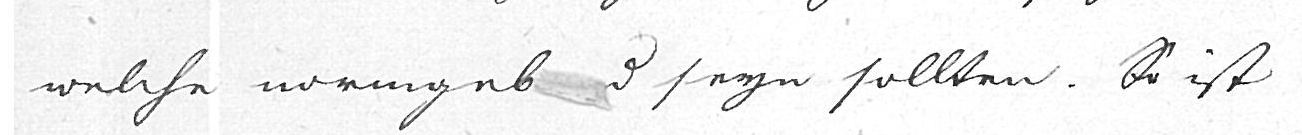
welche normgebend seyn sollten. So ist
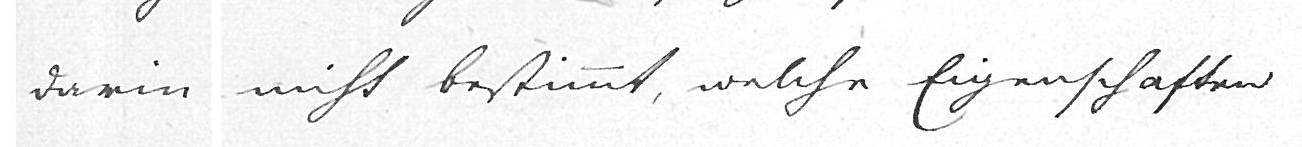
darn nicht bestimmt, welche Eigenschaften
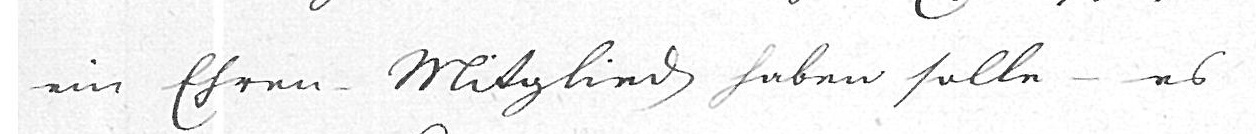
ein Ehren-Mitglied haben solle - es
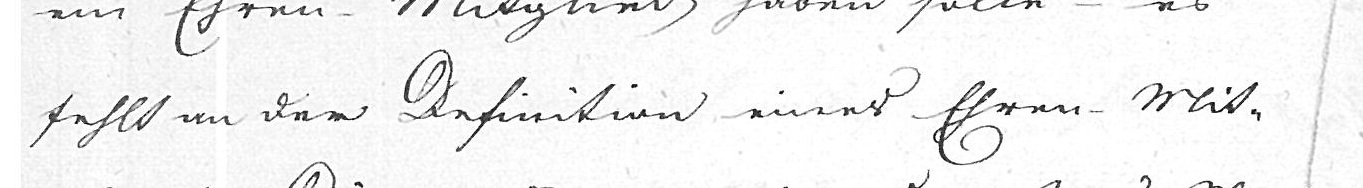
fehlt an der Definition eines Ehren-Mit-
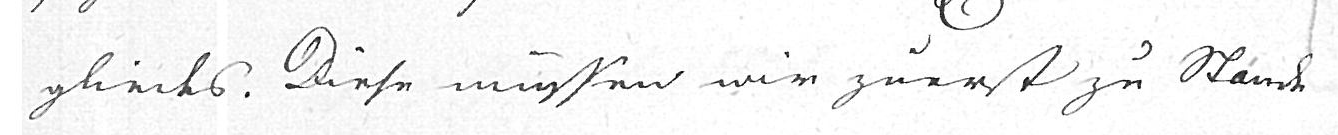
gliedes. Diese müssen wir zuerst zu Stande
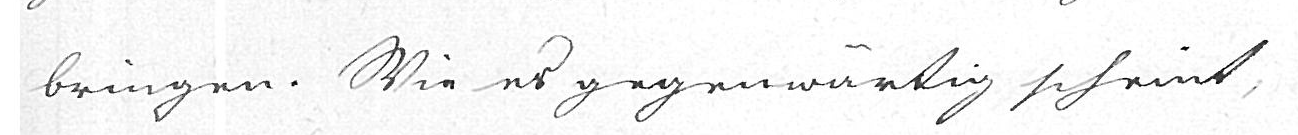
bringen. Wie es gegenwärtig scheint,
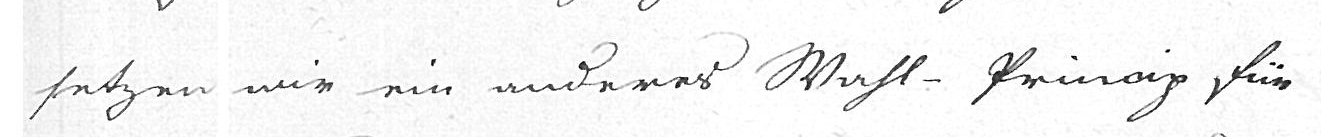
setzen wir ein anderes Wahl-Princip für
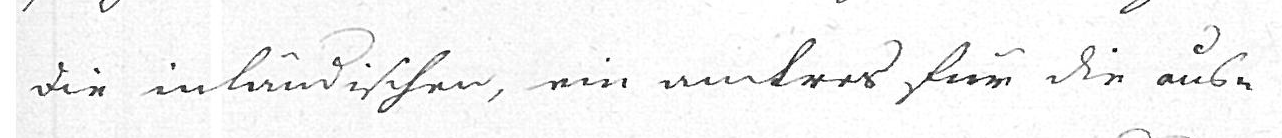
die inländischen, ein anderes für die aus-
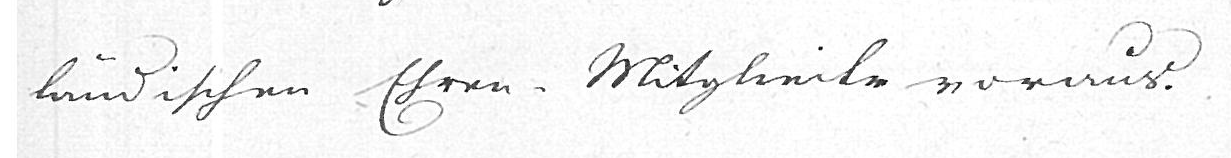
ländischen Ehren-Mitglieder voraus.
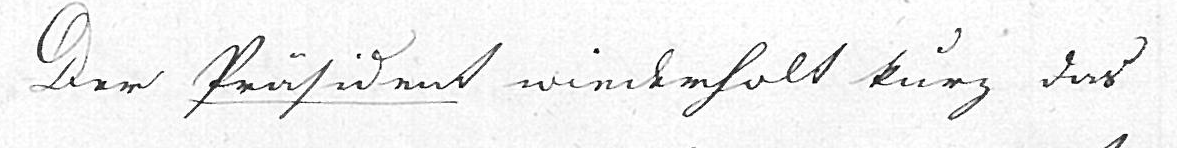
Der Präsident wiederholt kurz das
